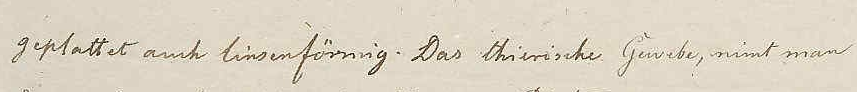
geplattet auch linsenförmig. Das thierische Gewebe, nimt man
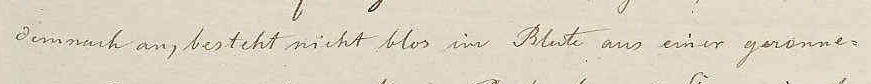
demnach an, besteht nicht blos im Blute aus einer geronne-
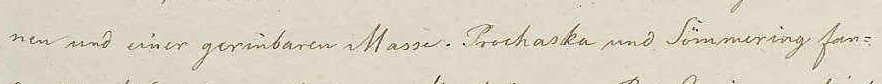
nen und einer gerinbaren Masse. Prochaska und Sömmering fan-
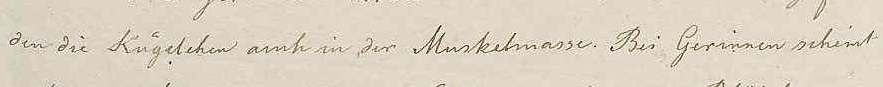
den die Kügelchen auch in der Muskelmasse. Bei Gerinnen scheint
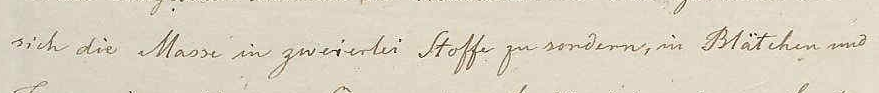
sich die Masse in zweierlei Stoffe zu sondern, in Blätchen und
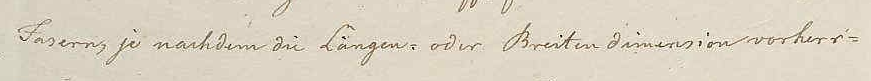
Fasern, je nachdem die Längen- oder Breitendimension vorherr-
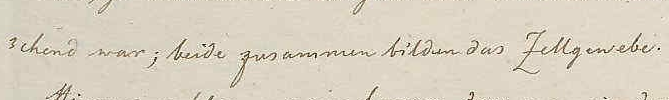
schend war; beide zusammen bilden das Zellgewebe.
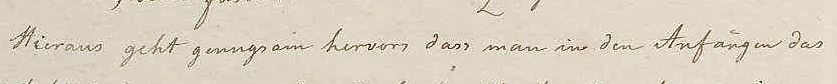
Hieraus geht genugsam hervor, dass man in den Anfängen das
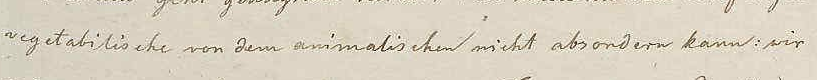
vegetabilische von dem animalischen nicht absondern kann: wir
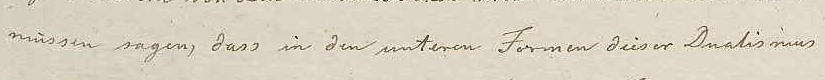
müssen sagen, dass in den unteren Formen dieser Dualismus
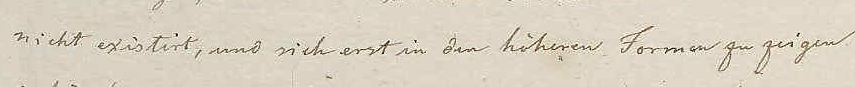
nicht existirt, und sich erst in den höheren Formen zu zeigen
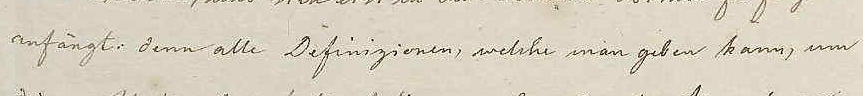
anfängt: denn alle Definizionen, welche man geben kann, um
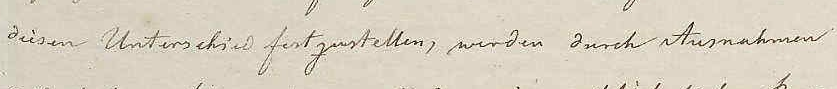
diesen Unterschied festzustellen, werden durch Ausnahmen
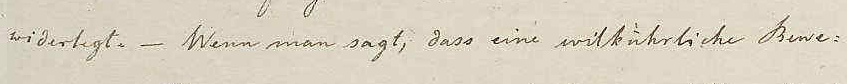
widerlegt. – Wenn man sagt, dass eine wilkührliche Bewe-
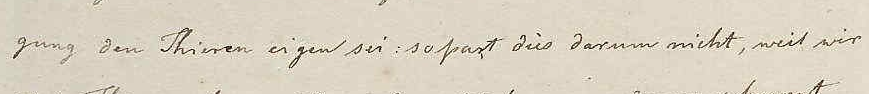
gung den Thieren eigen sei: so past dies darum nicht, weil wir
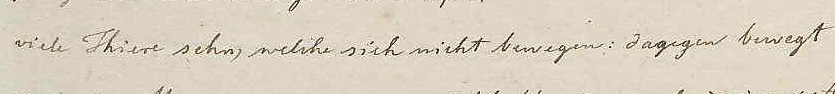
viele Thiere sehn, welche sich nicht bewegen: dagegen bewegt
